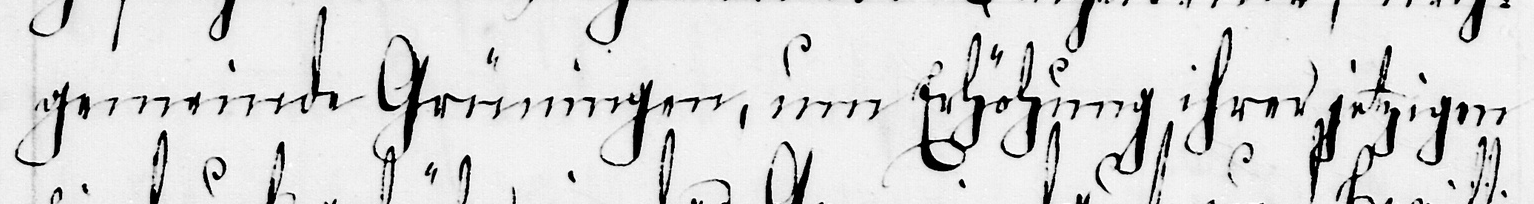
gemeinde Grüningen, um Erhöhung ihrer jetzigen
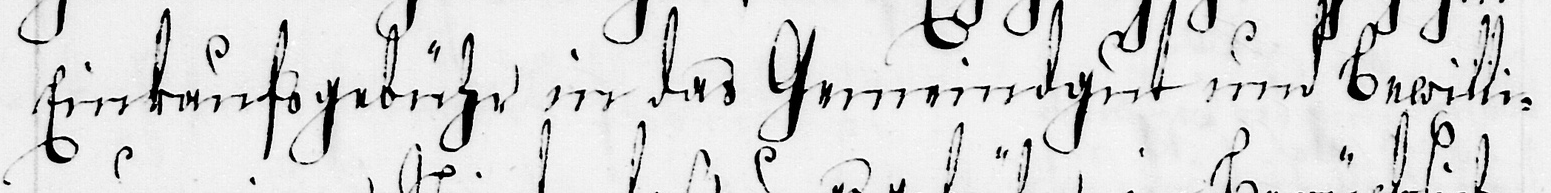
Einkaufsgebühr in das Gemeindgut und Bewilli¬
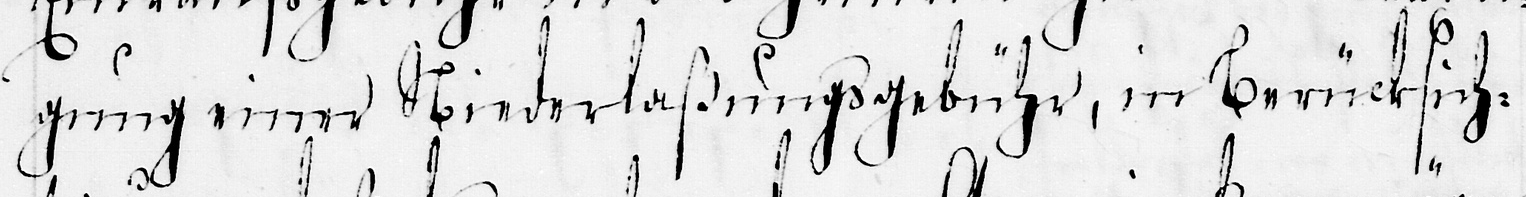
gung einer Niederlaßungsgebühr, in Berücksich¬
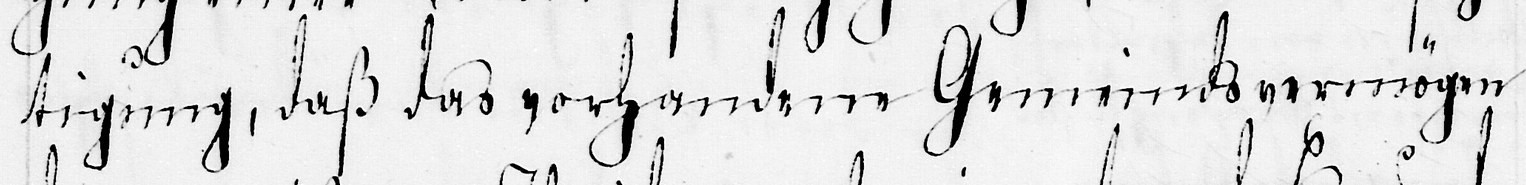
tigung, daß das vorhandene Gemeindsvermögen
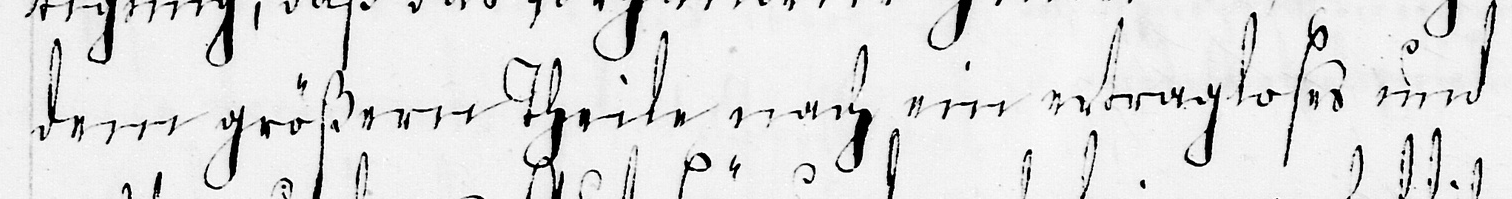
dem größern Theile nach ein ertragloses und
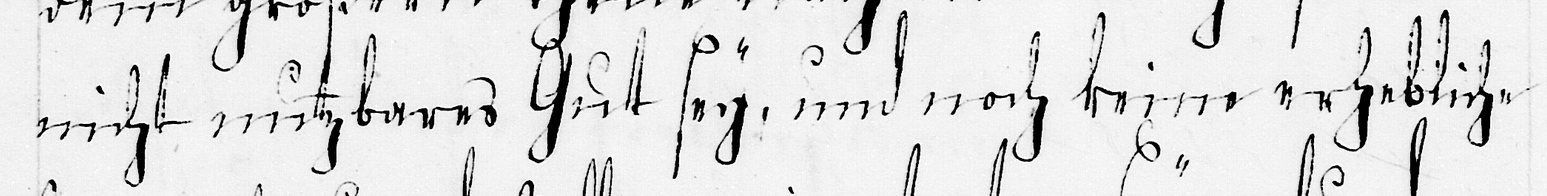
nicht nutzbares Gut sey, und noch keine erhebliche
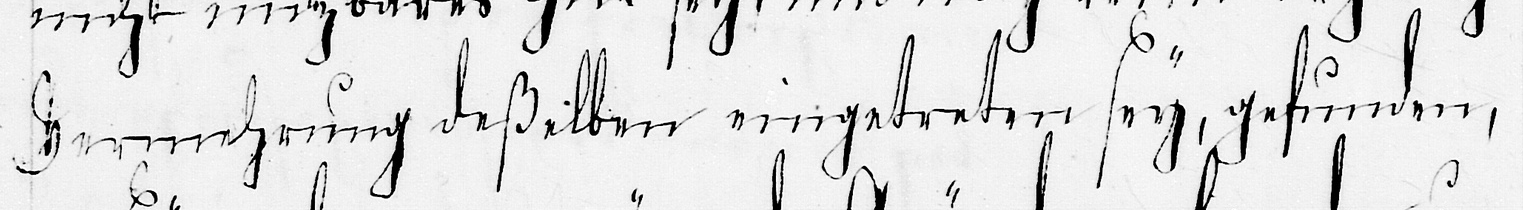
Vermehrung deßelben eingetreten sey, gefunden,
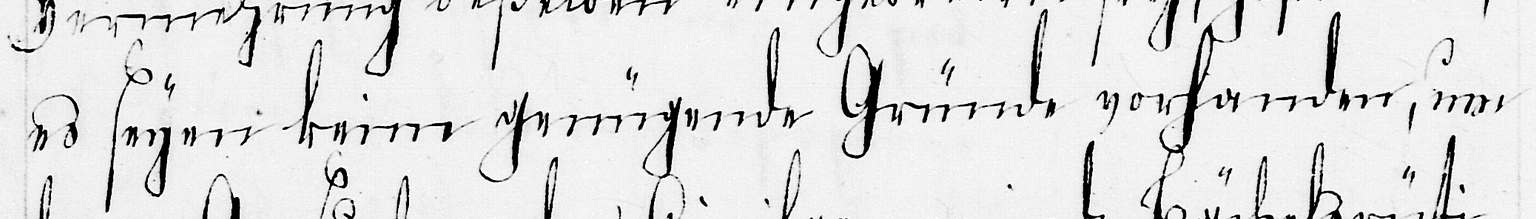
es seyen keine genügende Gründe vorhanden, um
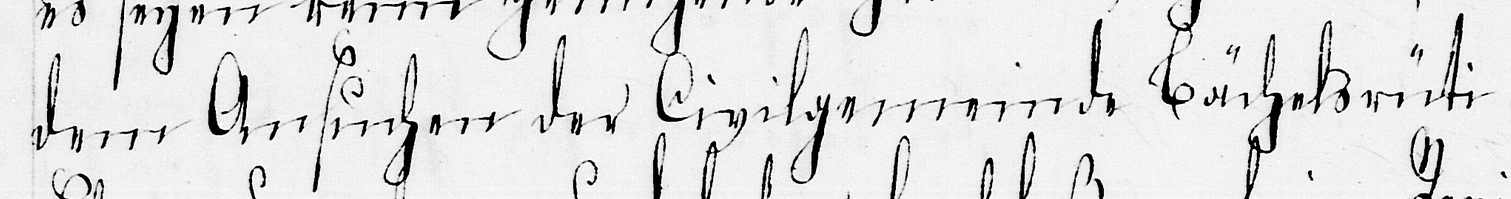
dem Ansuchen der Civilgemeinde Bächelsrüti
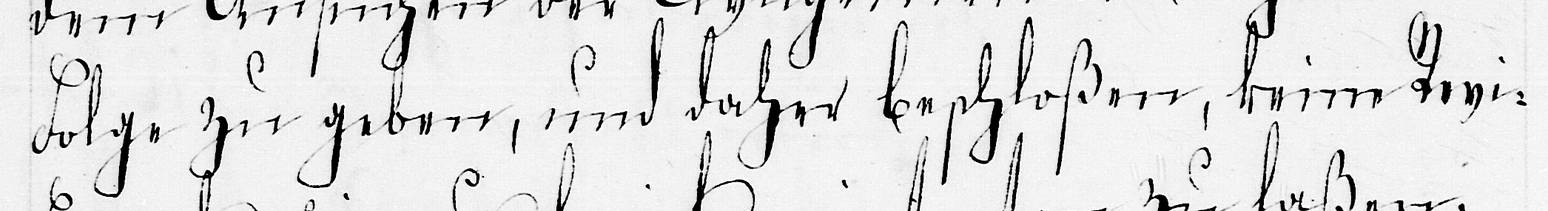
Folge zu geben, und daher beschloßen, keine Revi¬
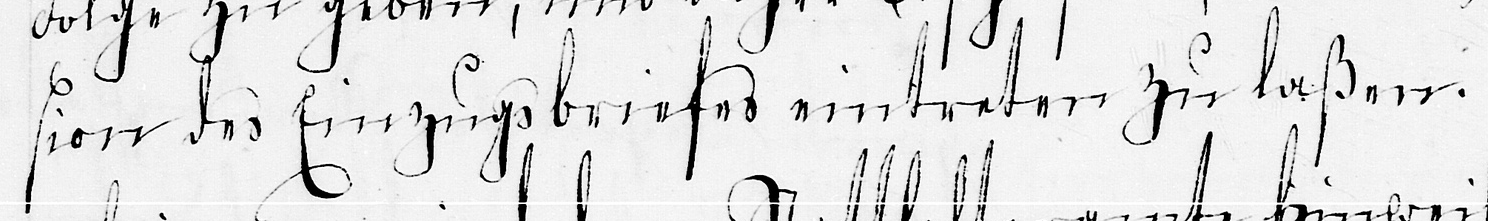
sion des Einzugsbriefes eintreten zu laßen.
